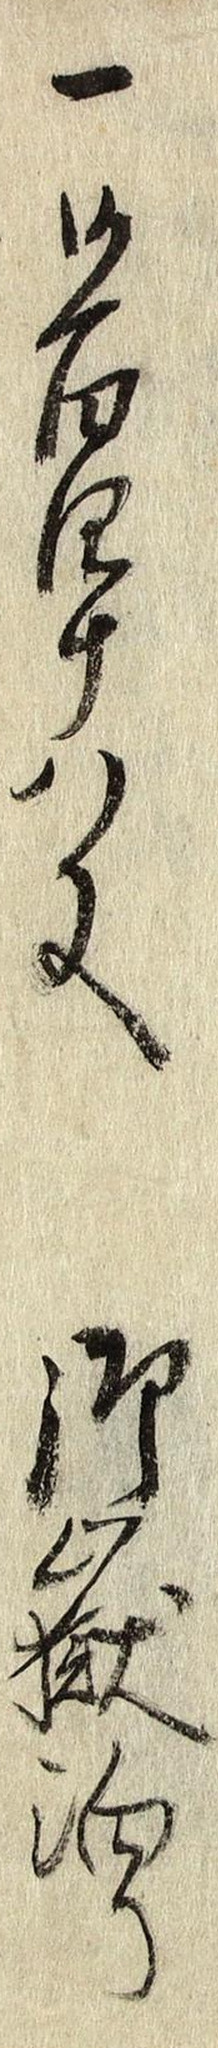一弐百四十八文御嶽泊り
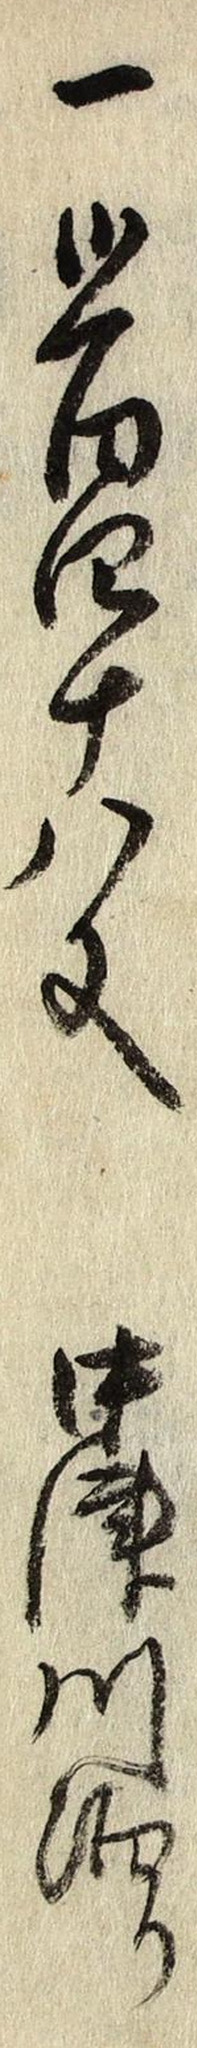一弐百四十八文中津川泊り
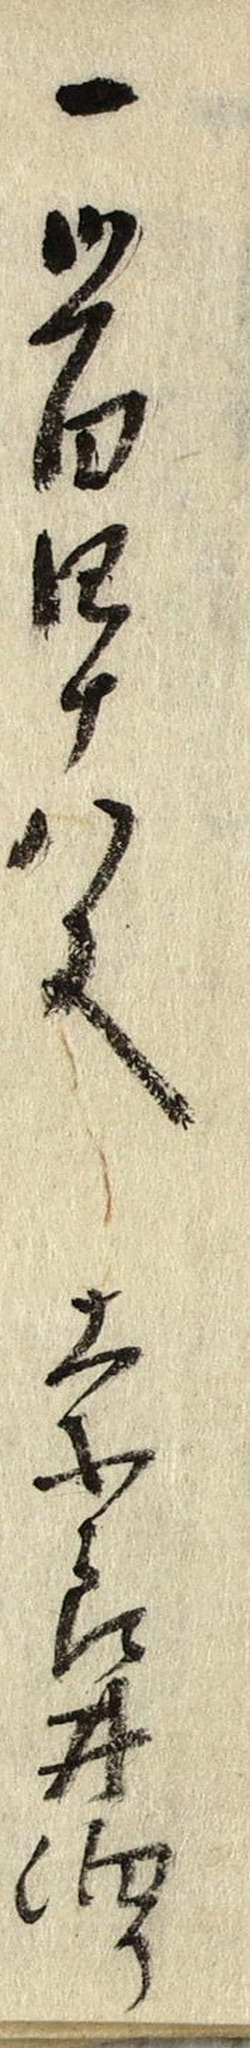一弐百四十八文奈良井泊り
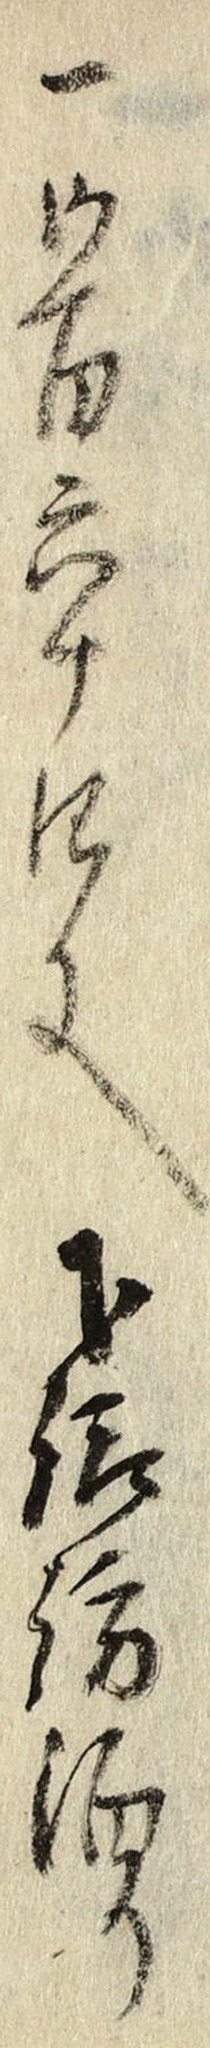一弐百六十四文下諏訪泊り
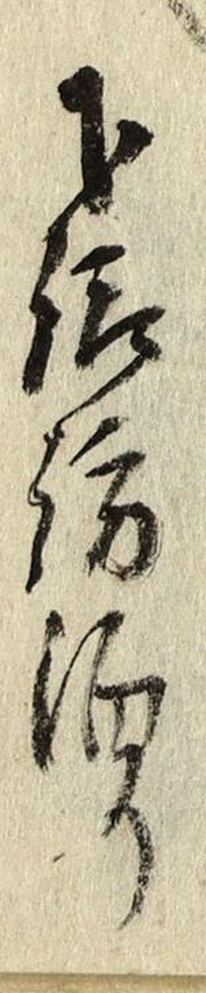下諏訪泊り
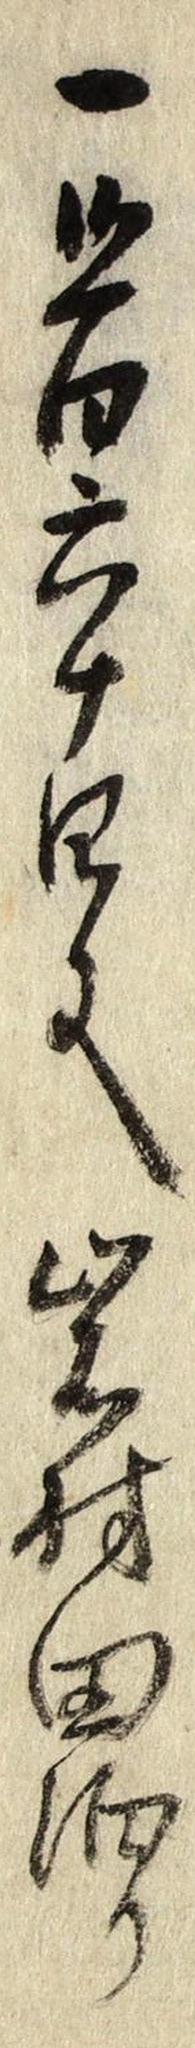一弐百六十四文岩村田泊り
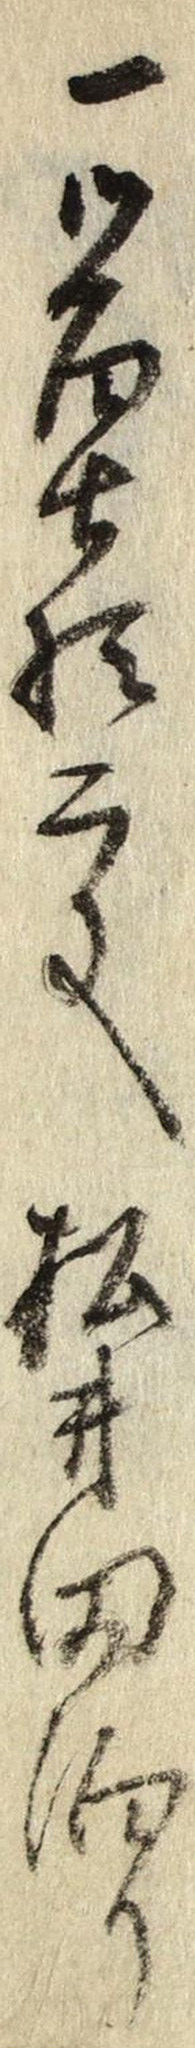一弐百七拾二文松井田泊り
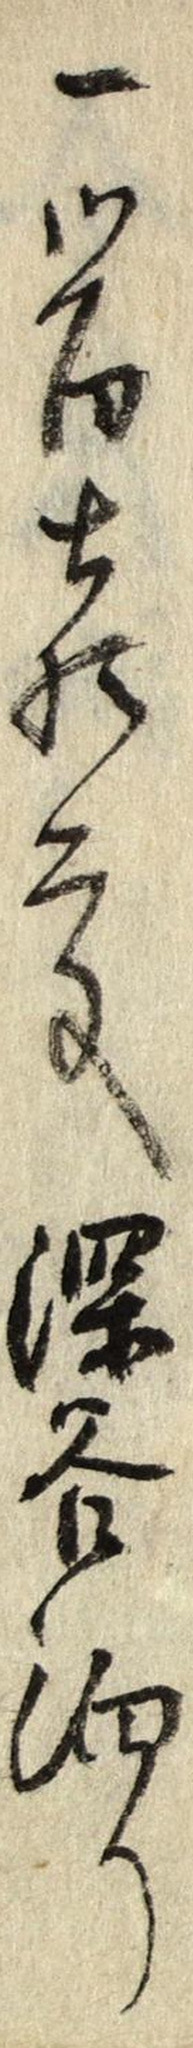一弐百七拾ニ文深谷泊り
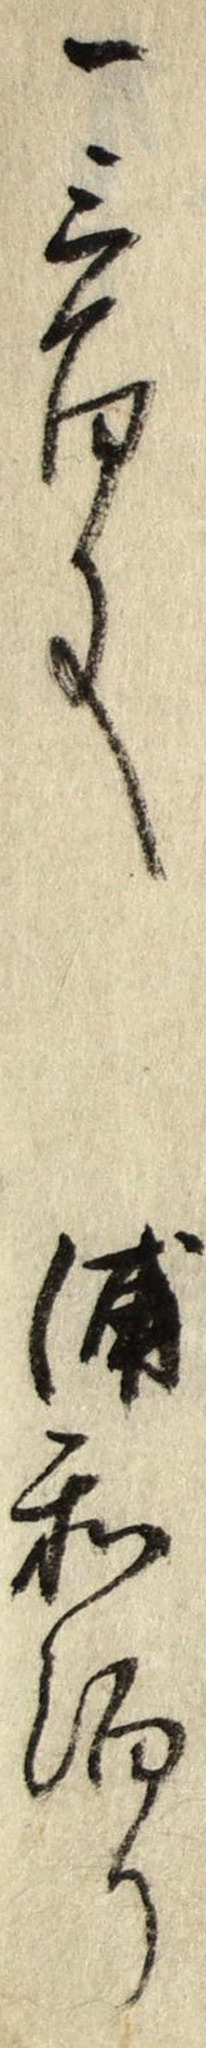一三百文浦和泊り

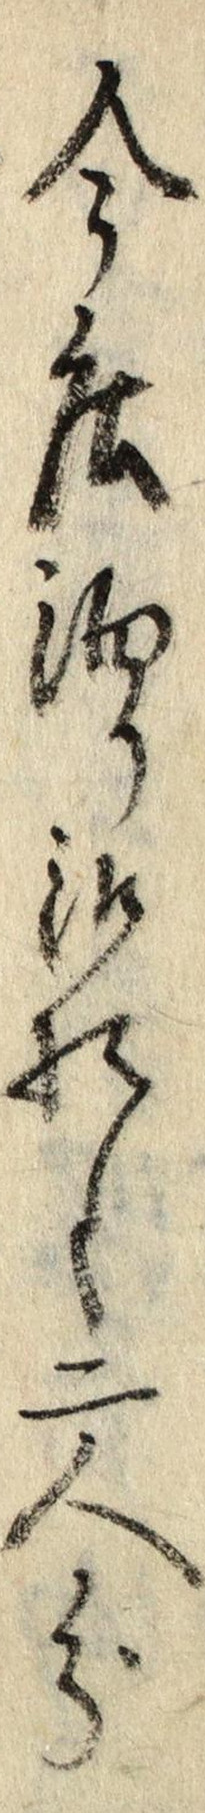今庄泊り銀拾匁二人分
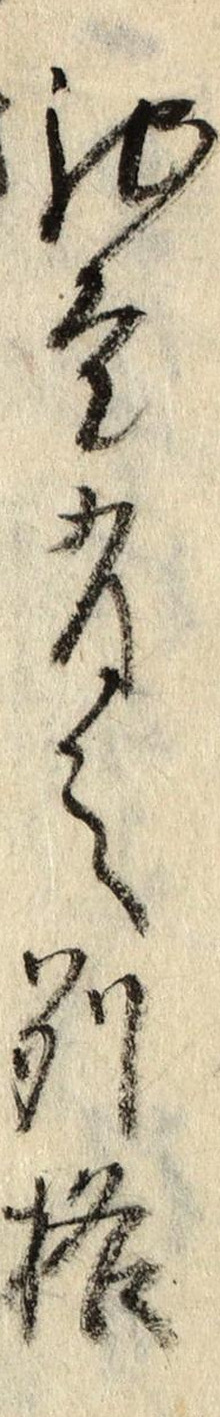馳走有之別格
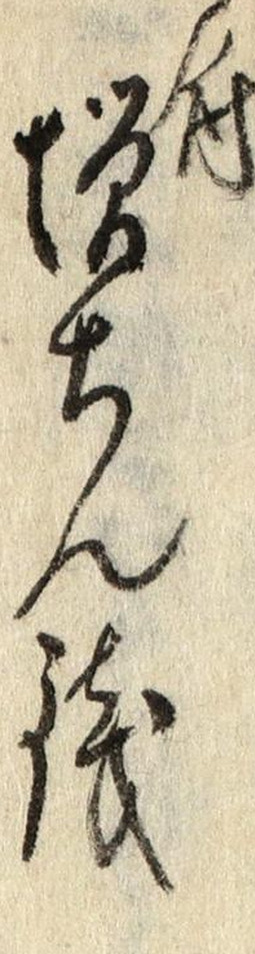増ちん銭
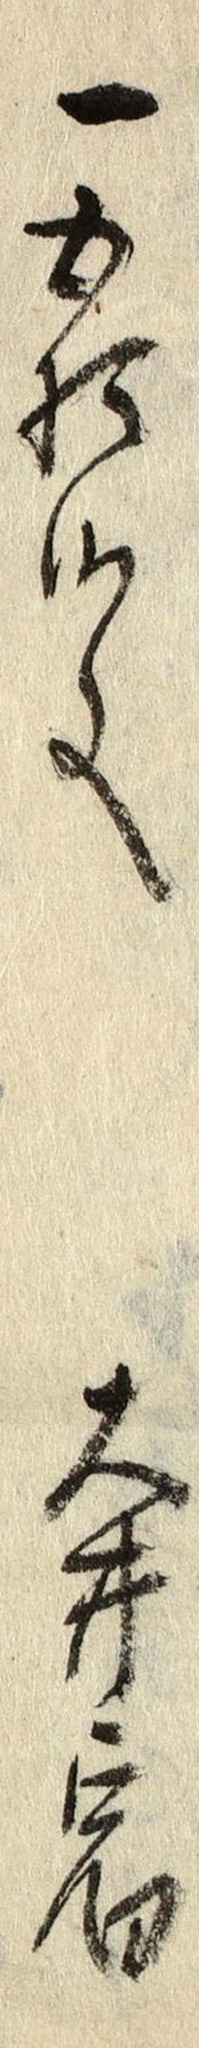一五拾弐文大井宿
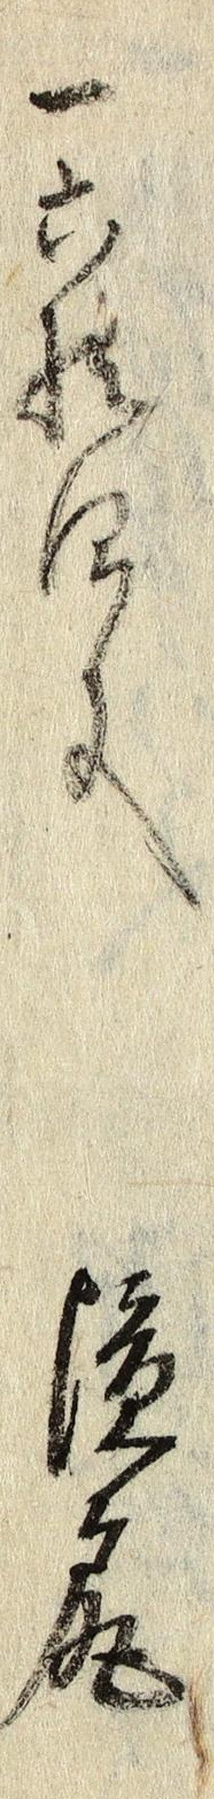一六拾四文塩尻
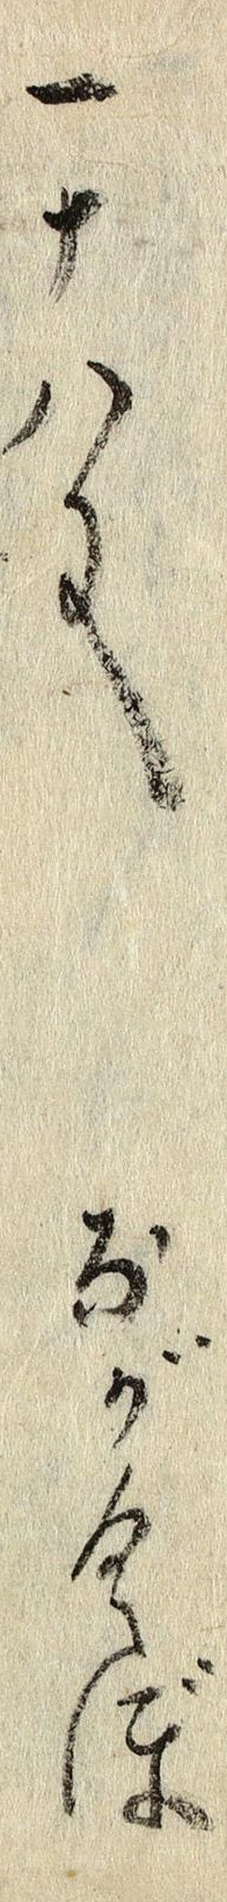一十八文ながくぼ
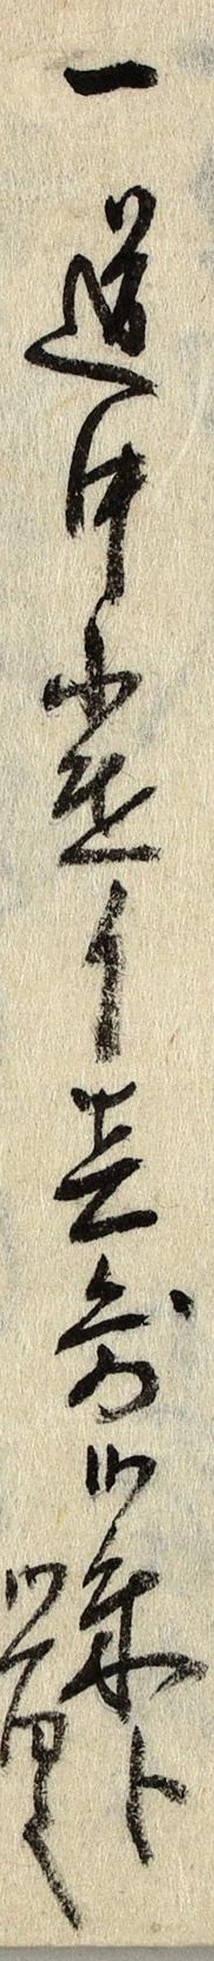一道中小遣イ壱歩弐朱ト
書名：中仙道道中覚
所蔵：福井県文書館 Fukui Prefectural Archives
